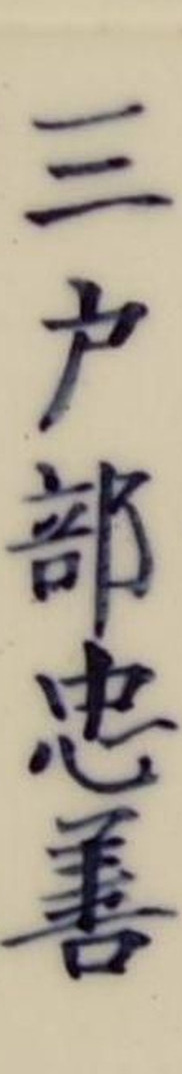三戸部忠善
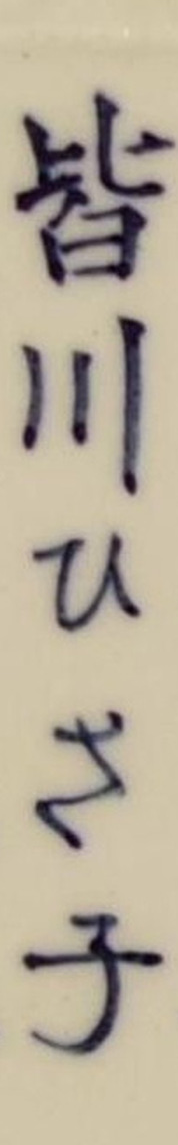皆川ひさ子
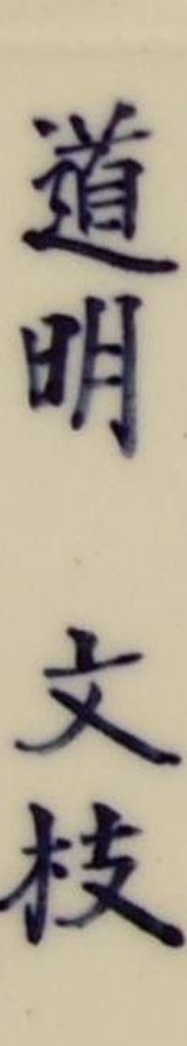道明文枝
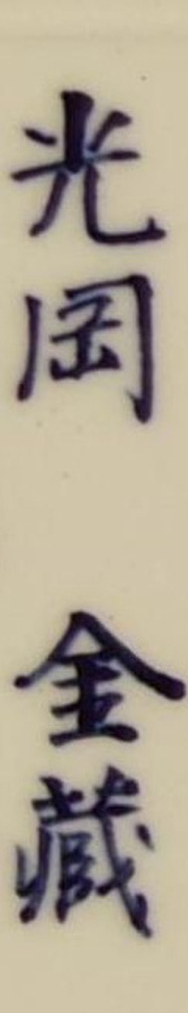光岡金蔵
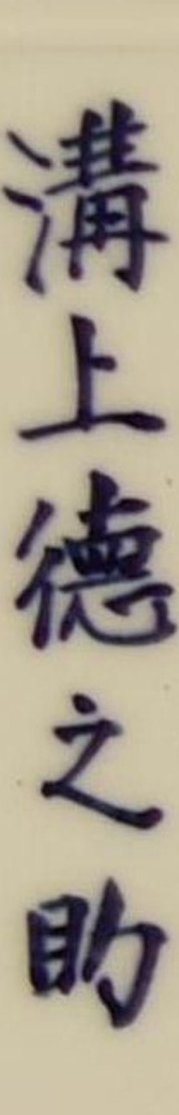溝上徳之助
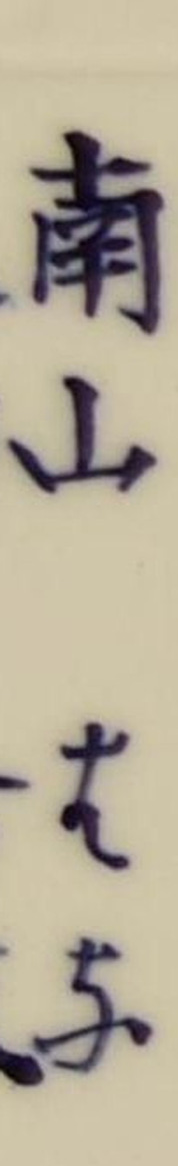南山はな
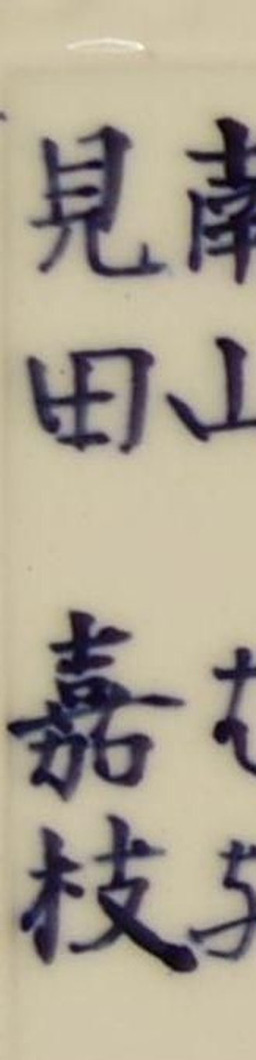見田嘉枝

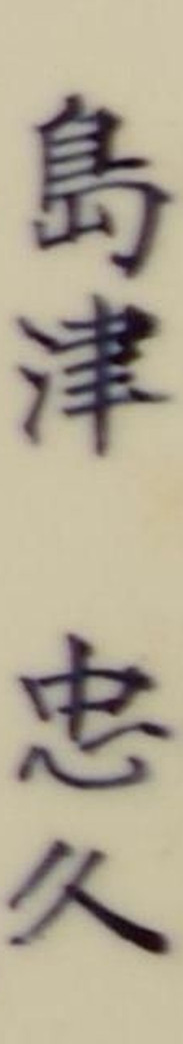島津忠久
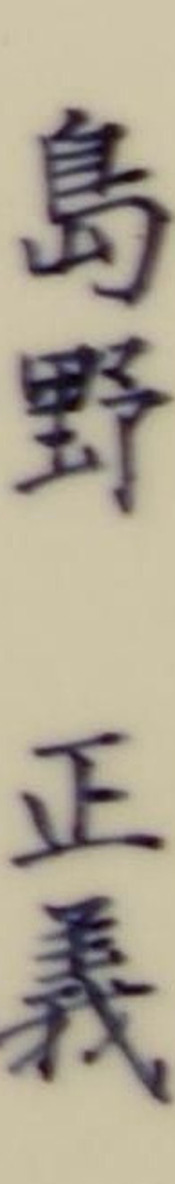島野正義
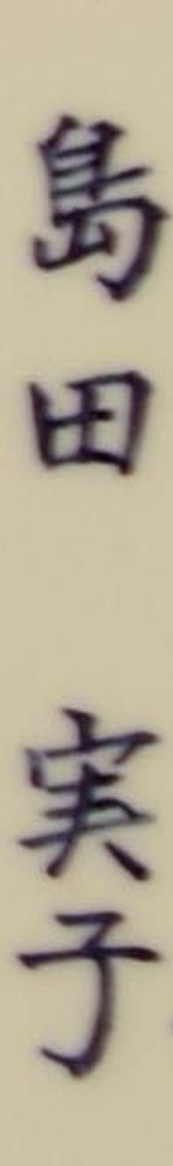島田実子
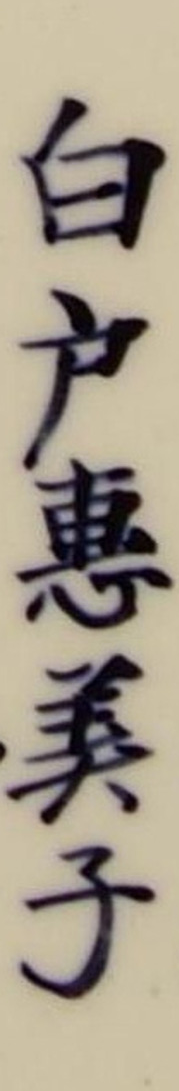白戸恵美子
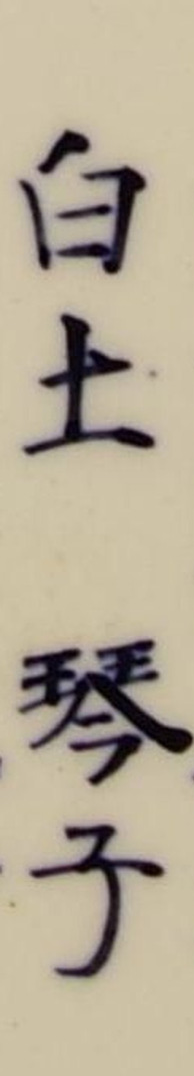白土琴子
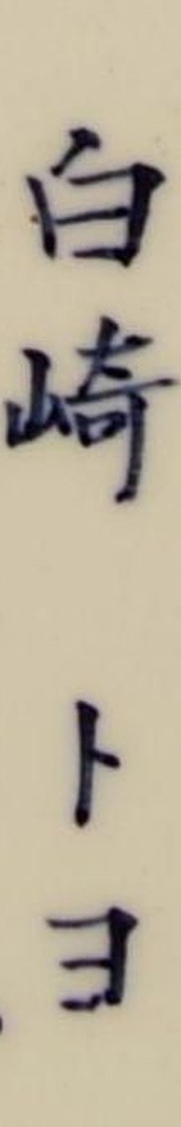白崎トヨ
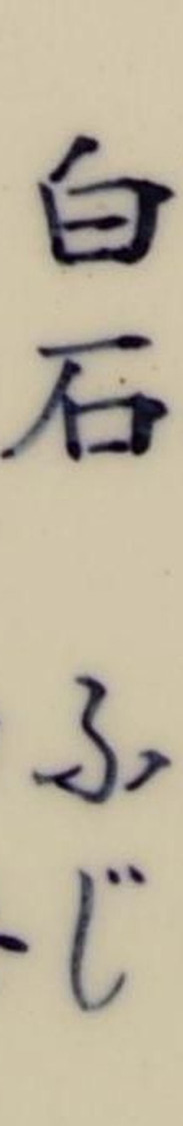白石ふじ
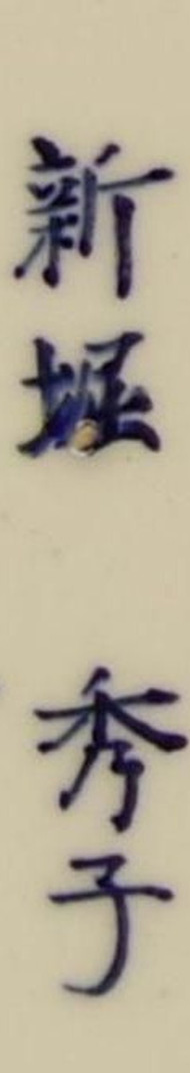新堀秀子
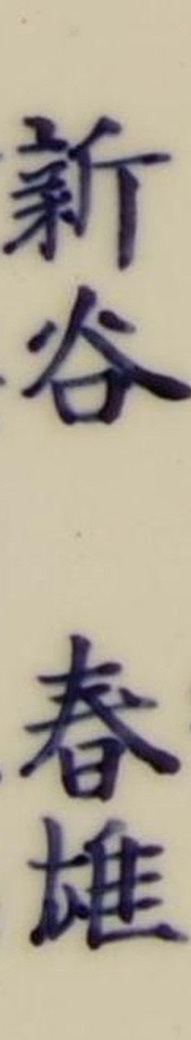新谷春雄
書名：E~L
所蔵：高野山金剛峯寺
